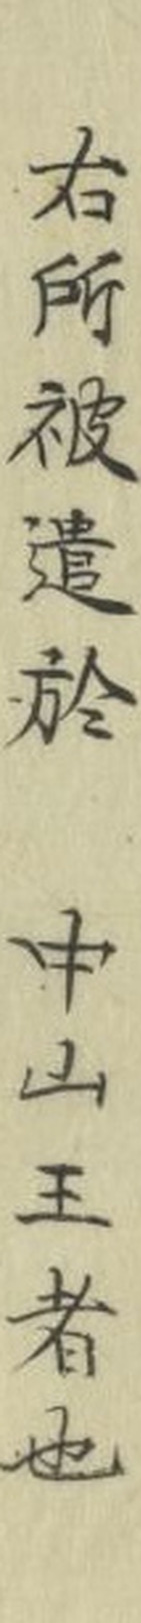右所被遣於中山王者也
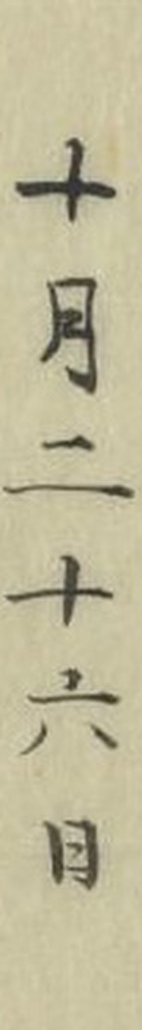十月二十六日
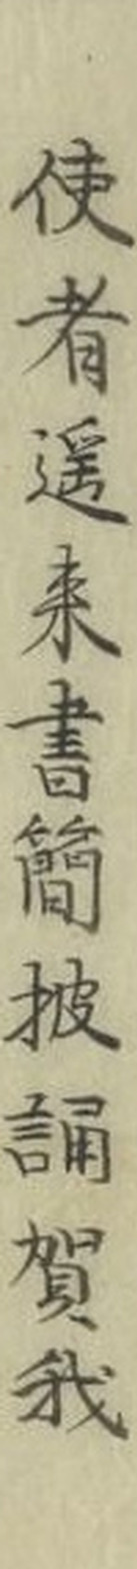使者遥来書簡披誦賀我
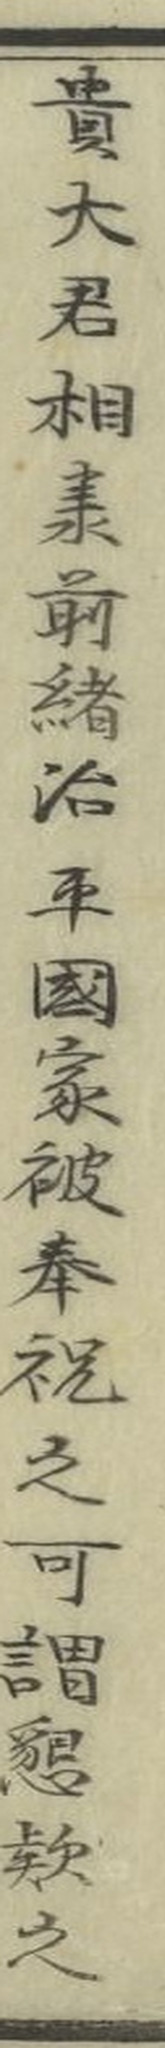貴大君相承前緒治平国家披奉祝之謂懇款之
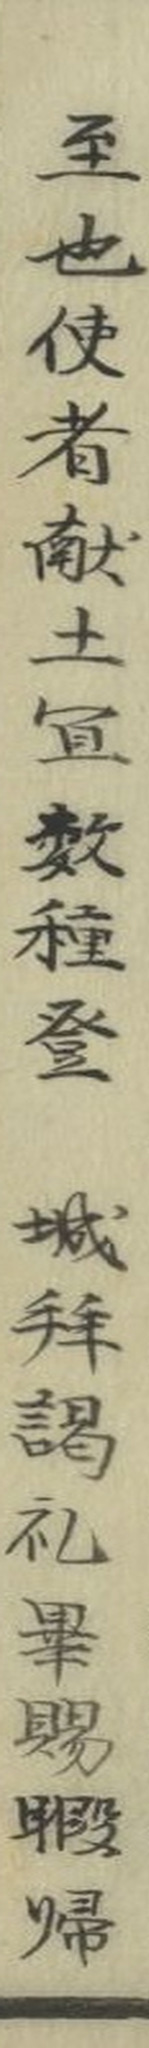至也使者献土冝数種登城拝謁礼畢賜暇帰

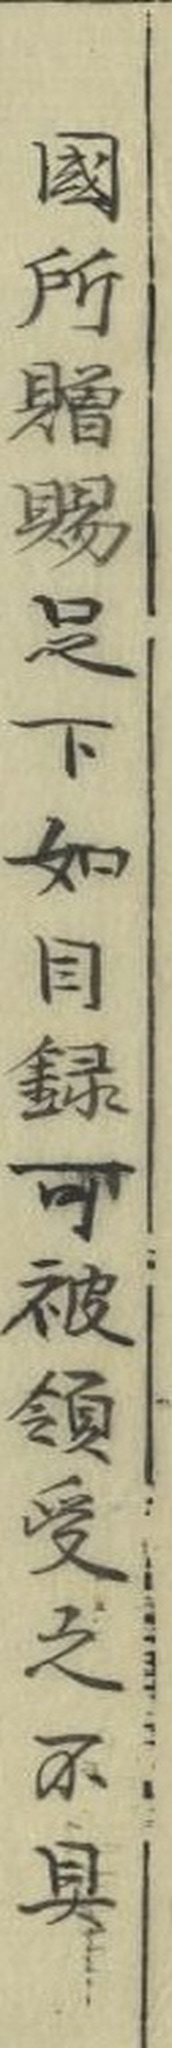国所贈賜足下如目録可被領受之不具
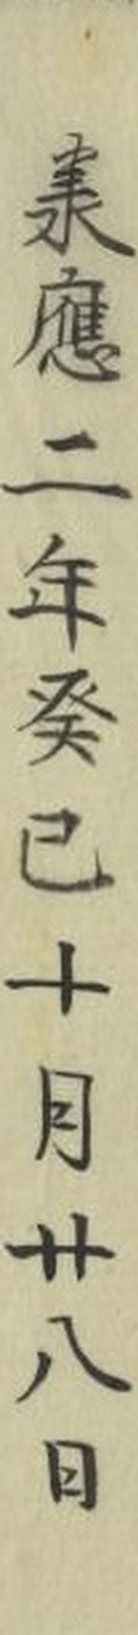承応二年辛己十月廿八日
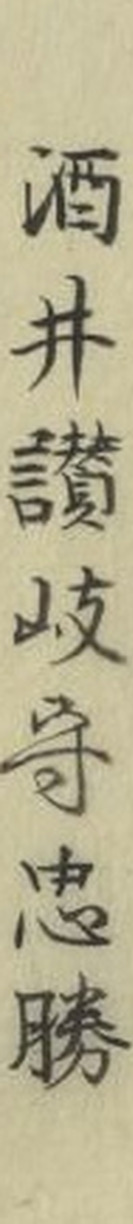酒井讃岐守忠勝
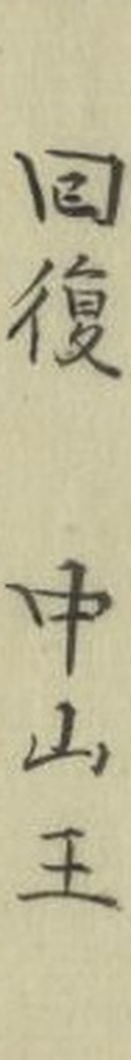回復中山王
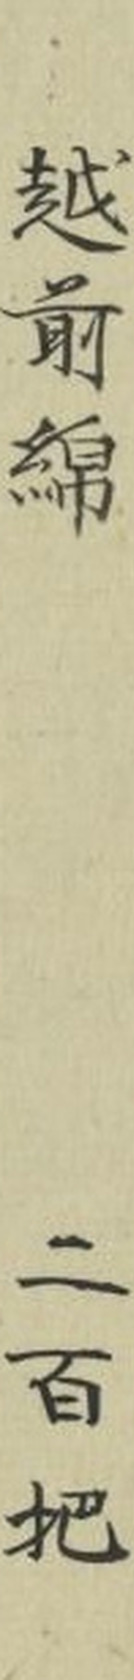越前綿二百把
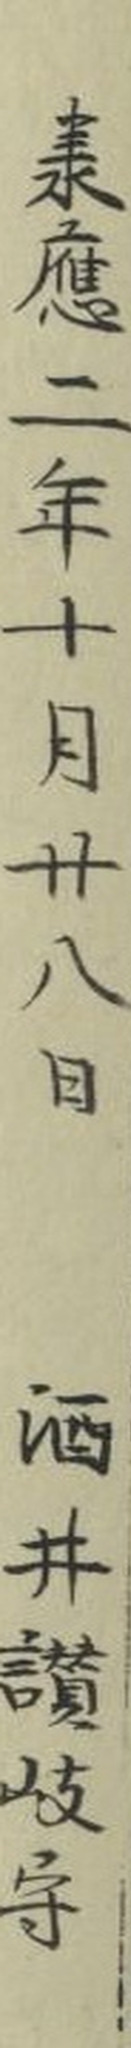承応二年十月廿八日酒井讃岐守
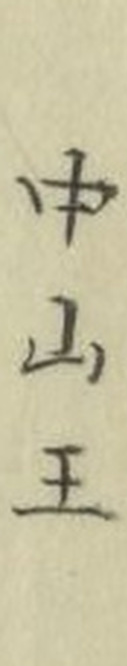中山王

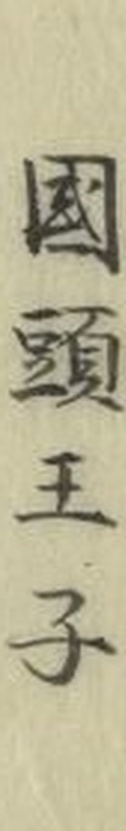国頭王子
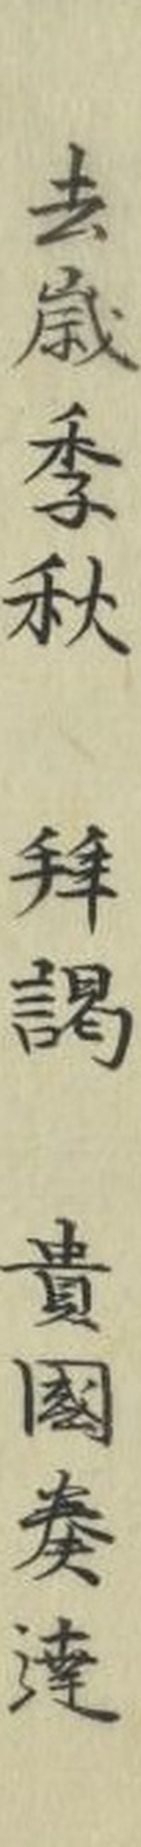去歳黄季秋拝謁貴国奉達
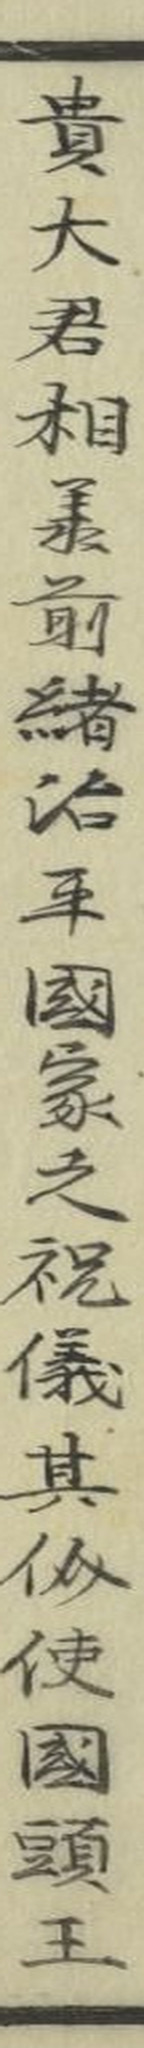貴大君相承前緒治平国家之祝儀其价使国頭王
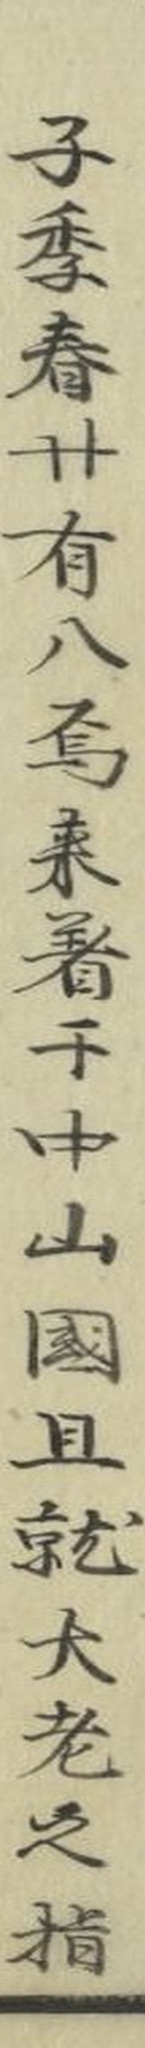子季春廿有八焉来着干中山国且就大老之指
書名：琉球往来（上）
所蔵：University of the Ryukyus Library
